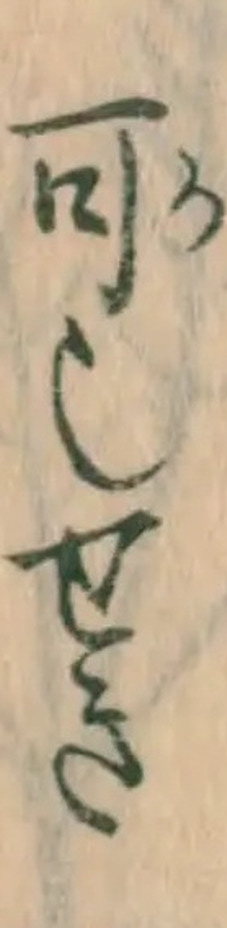可也せき
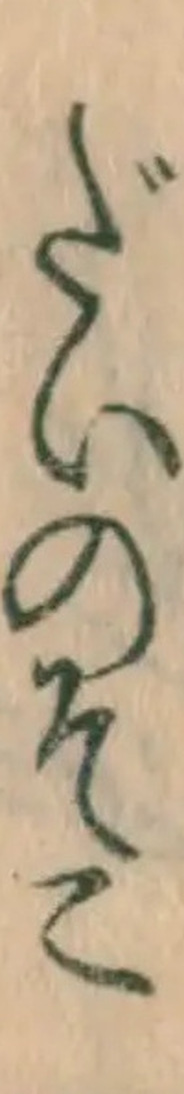だいのそこ
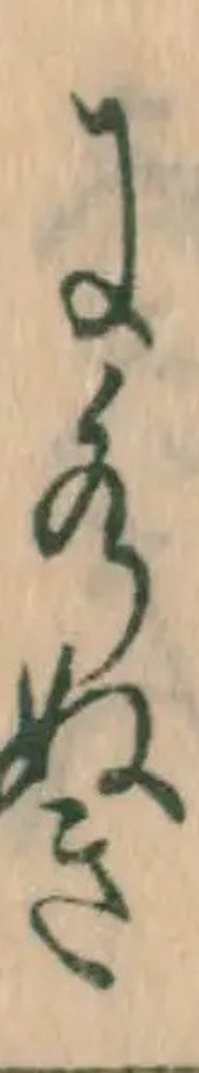に水ぬき
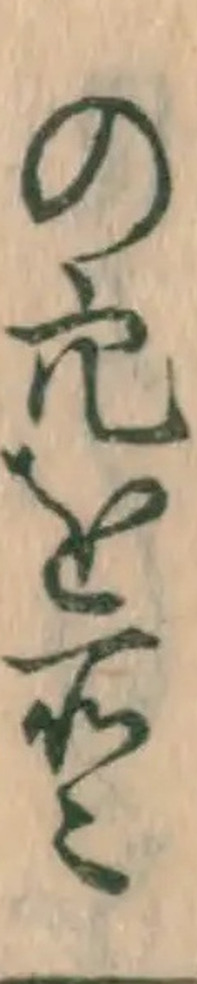の穴を所々
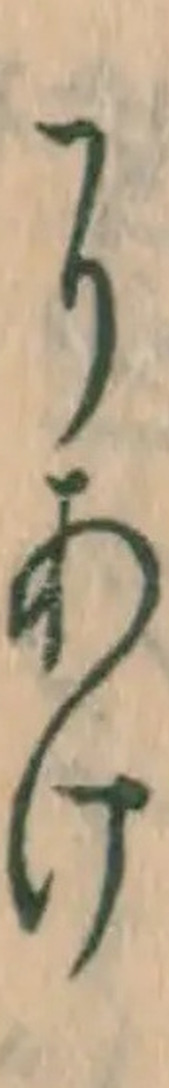にあけ
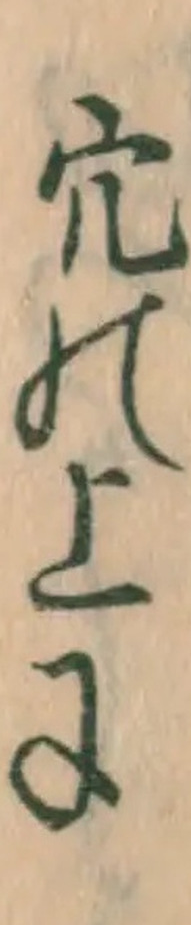穴の上に
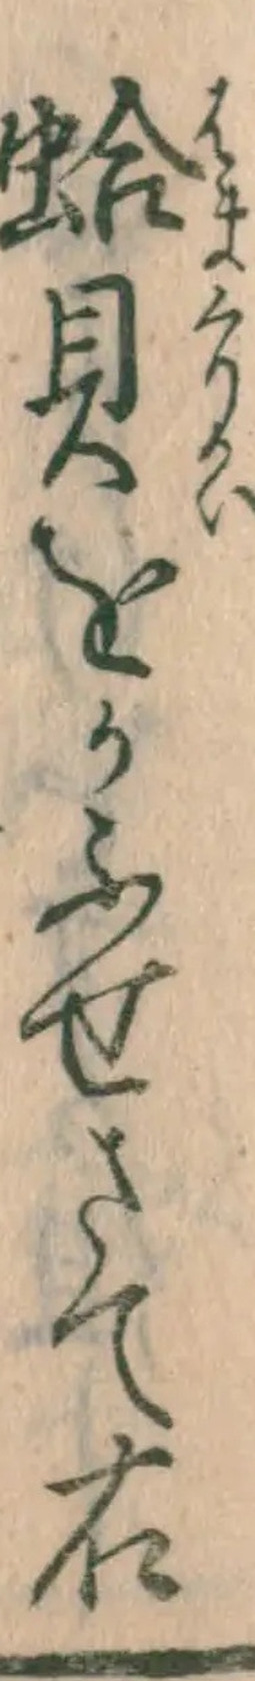蛤貝をかふせさて右
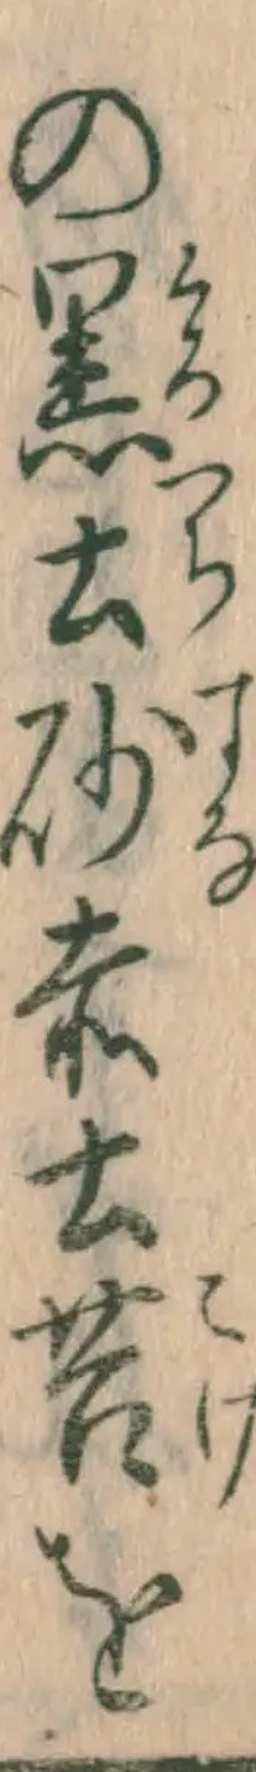の黒土砂赤土苔を
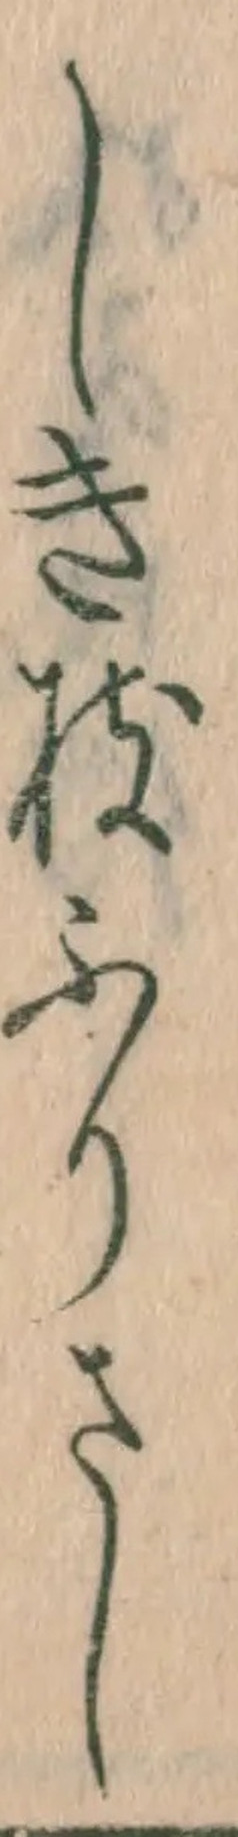しき枝ふりさし
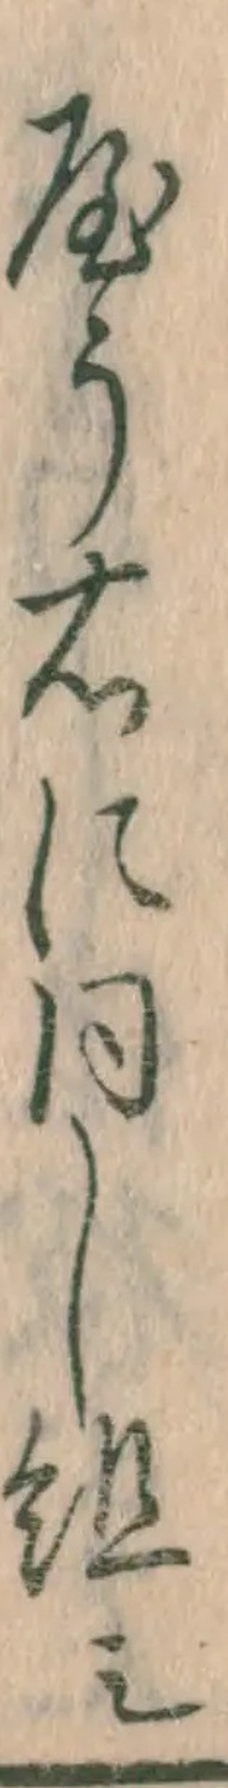やう右に同し組
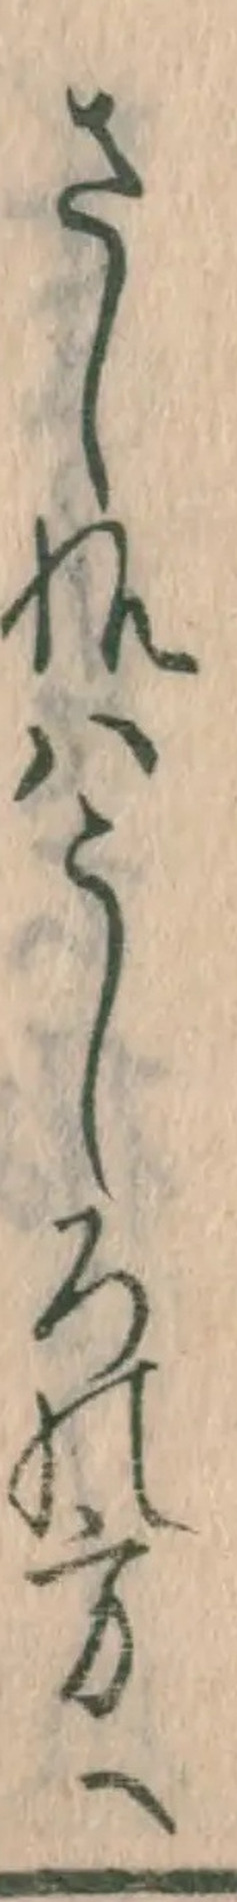さし様はうしろの方へ
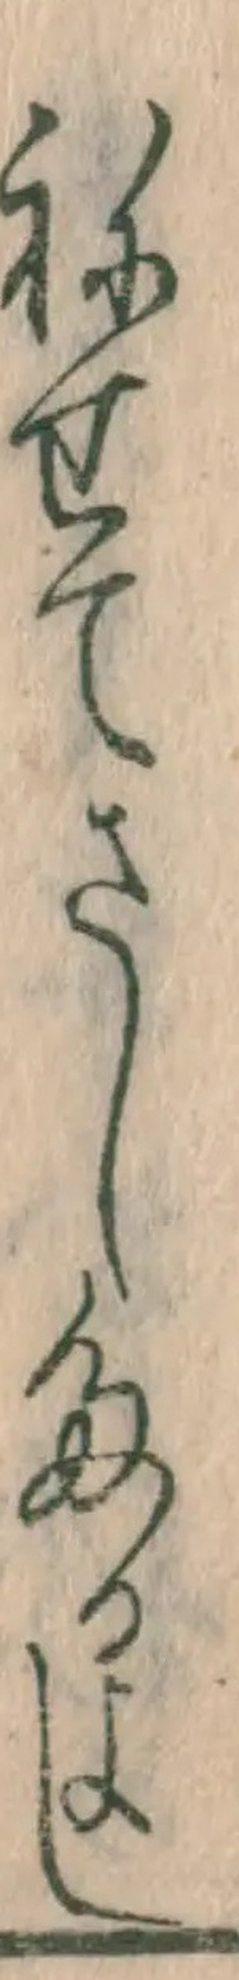ねせてさしたるよし
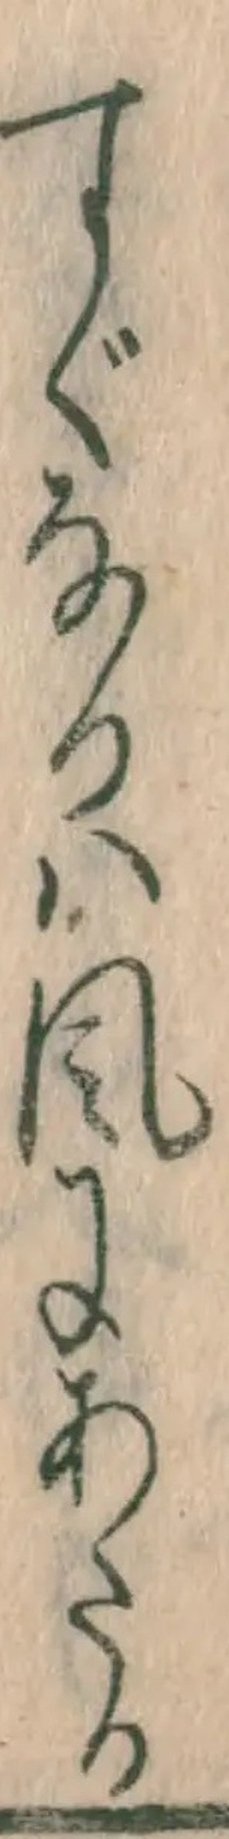すぐなるは風にあたる
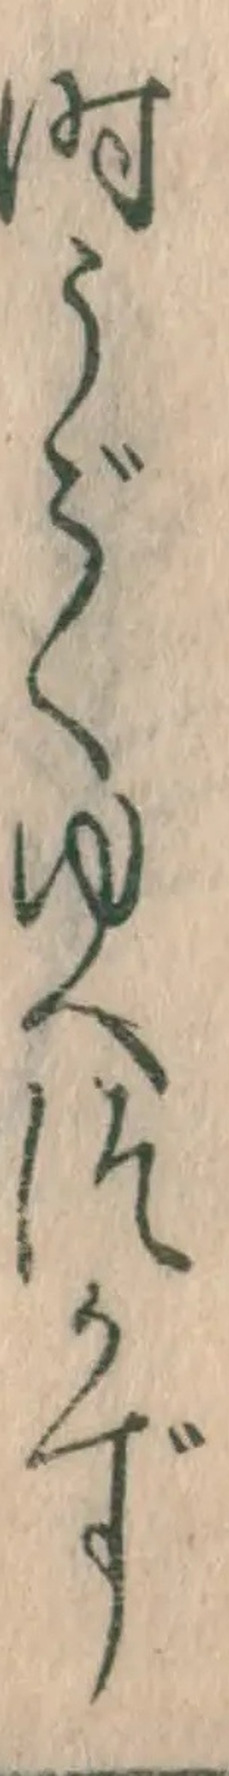時うごくゆへつかず
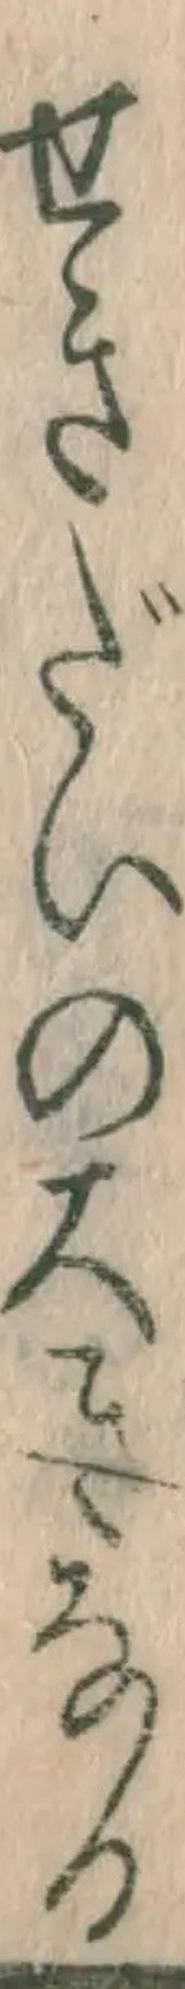せきだいの大きなる
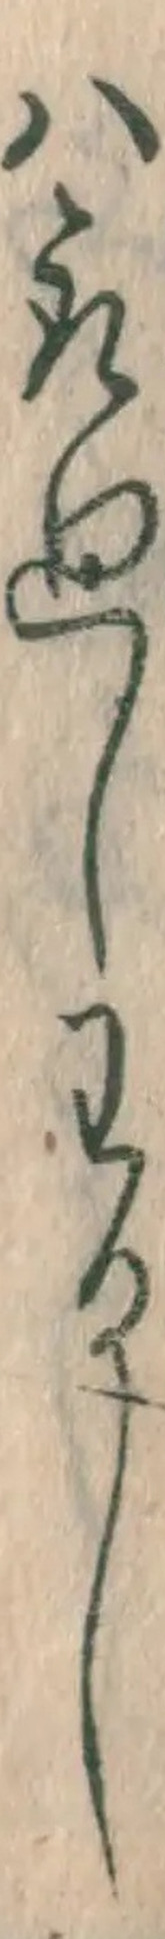は取廻しわるし
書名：錦繍枕 5巻. [5]
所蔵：国立国会図書館 National Diet Library, JAPAN
